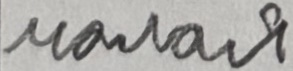малая
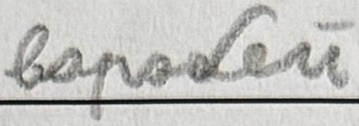воробей
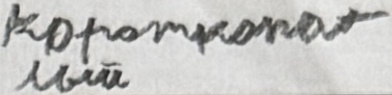короткопа-лый
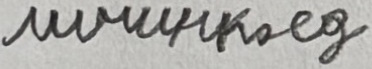личинкоед
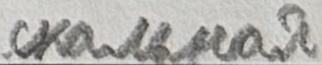скальная
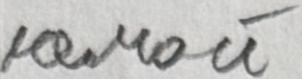немой
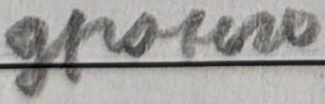дронго
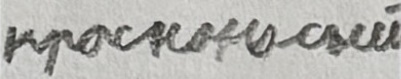красноносый
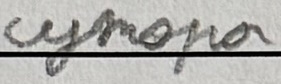сутора
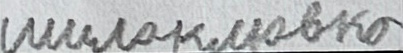шилоклювка
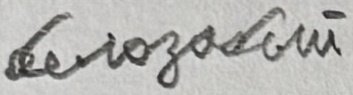белозобый
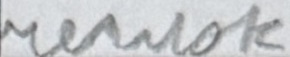чеглок
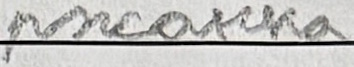ржанка
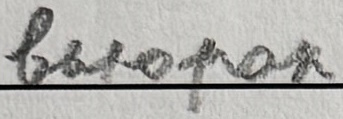вьюрок
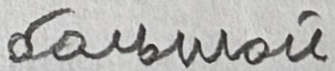большой
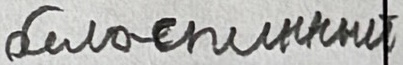белоспинный
